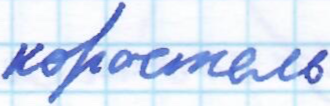коростель
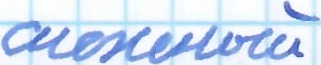снежный
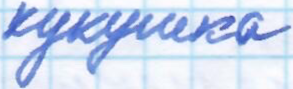кукушка
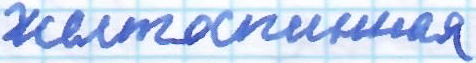желтоспинная
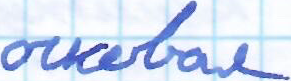очковая
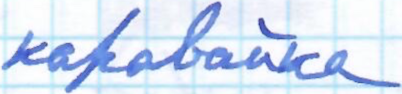каравайка
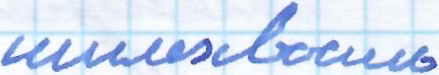шилохвость
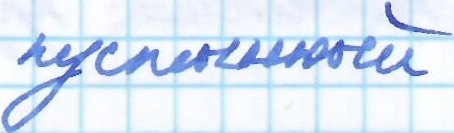пустынный
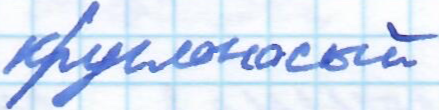круглоносый
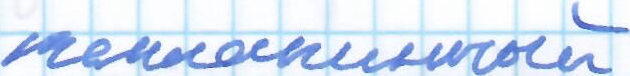темноспинный
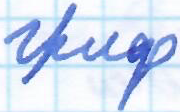гриф
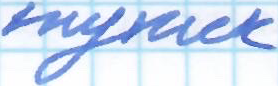тупик
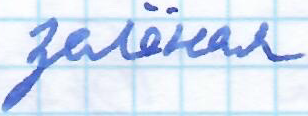зелёная
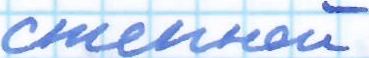степной
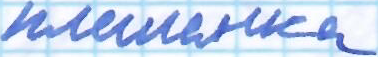плешанка
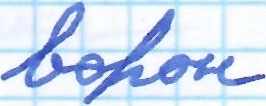ворон
